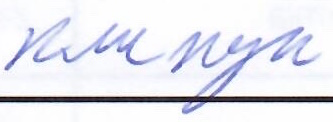клипун
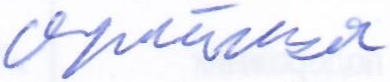серийския
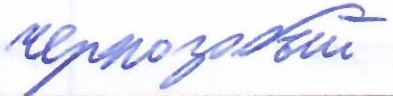чернозобый
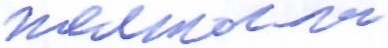желтоспи
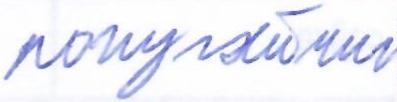попугайчик
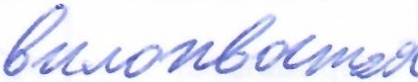вилохвостая
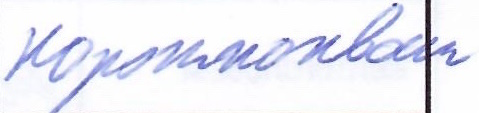короклюхвост
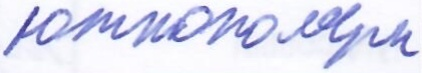южнополярн
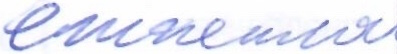египется
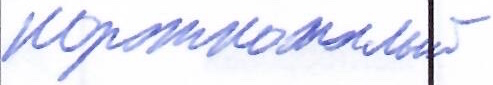короткопалый
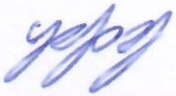удод
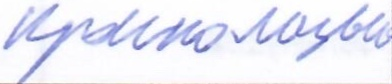краснолазыи
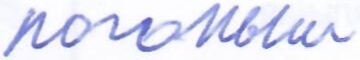погоныш
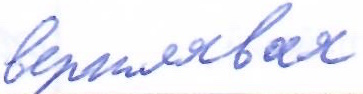вертлявая
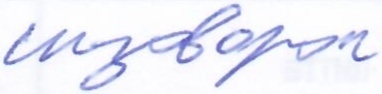сизоворон
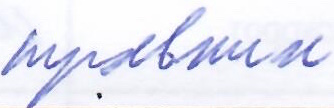травник
